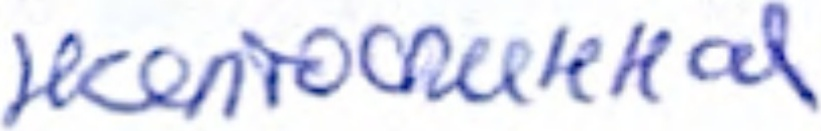желтоспинная
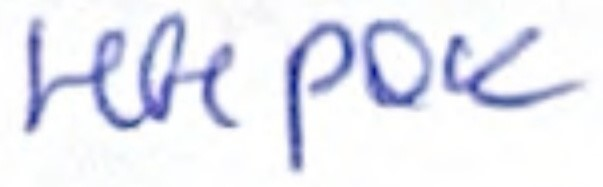ны рок
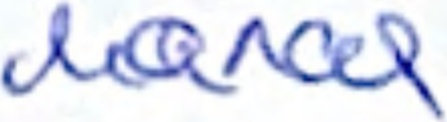малая
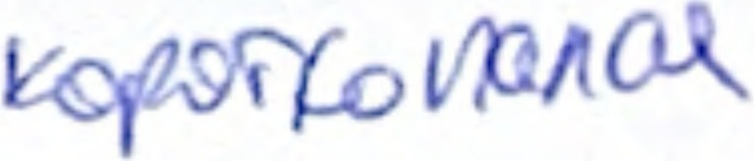короткопалая
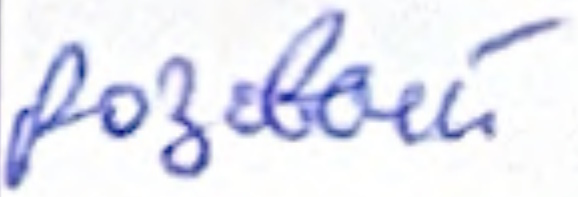розовый
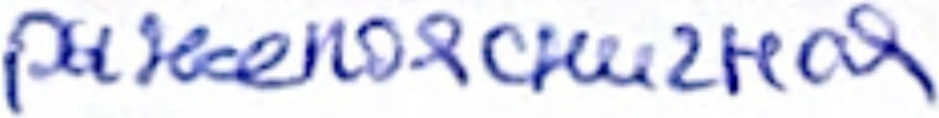рыжепоясничная
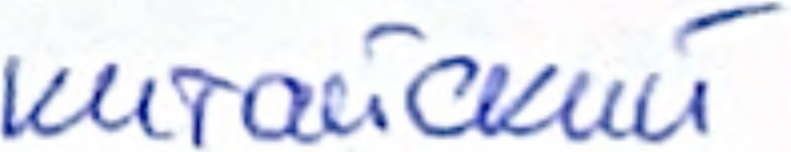китайский
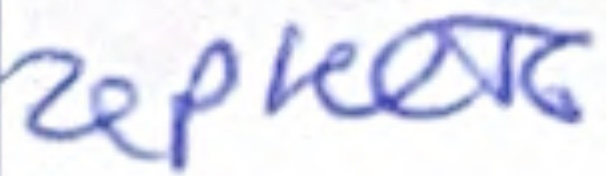чернеть
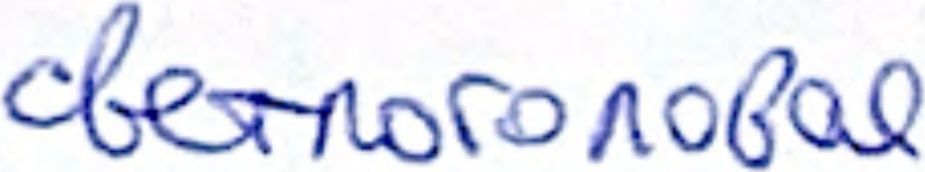светлоголовая
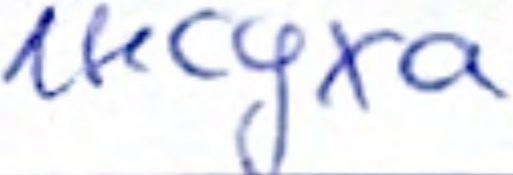лысуха
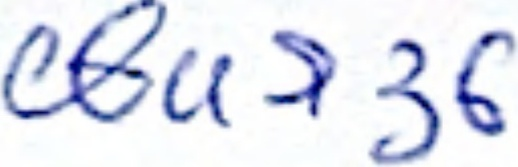свиязь
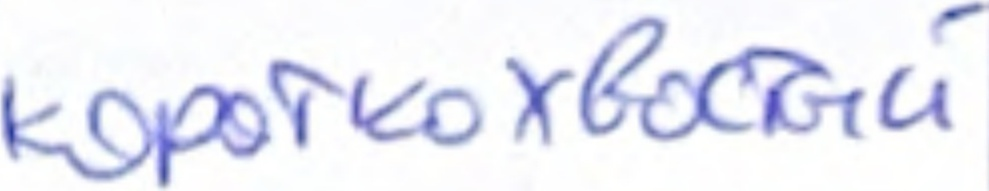короткохвостый
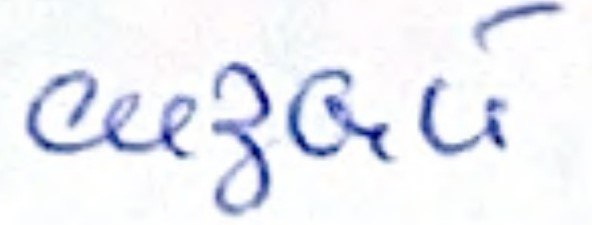сизый
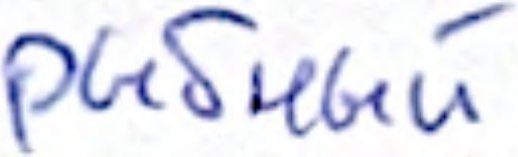рыбный
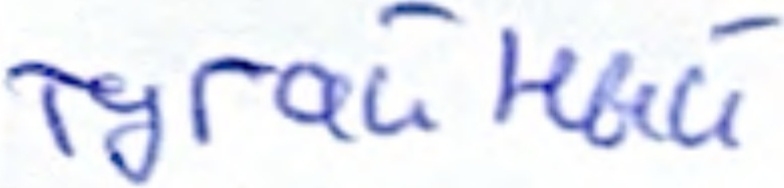тугайный
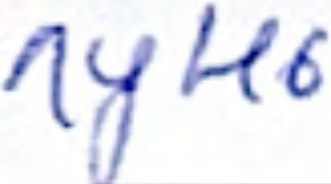лунь
